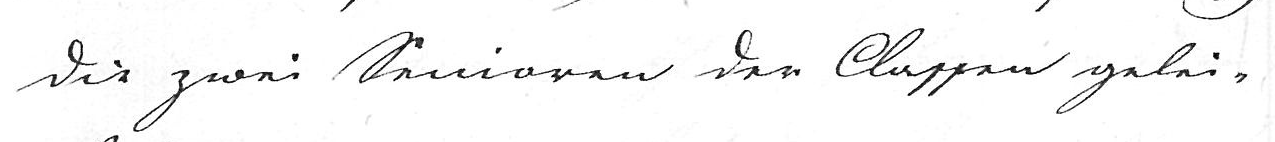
die zwei Senioren der Classen gelei-
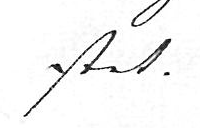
stet.
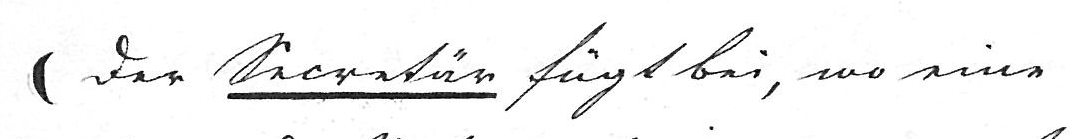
(Der Secretär fügt bei, wo eine
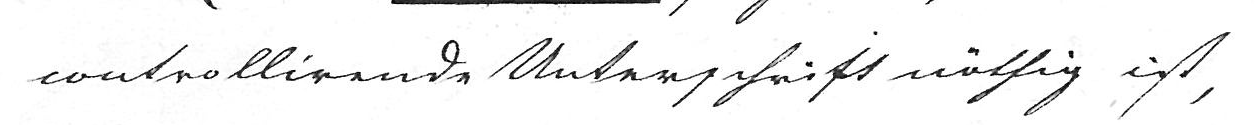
controllirende Unterschrift nöthig ist,
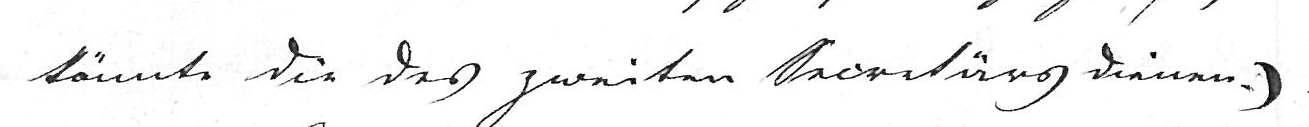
könnte die des zweiten Secretärs dienen.)
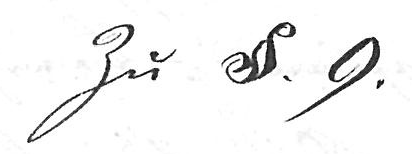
Zu §. 9.
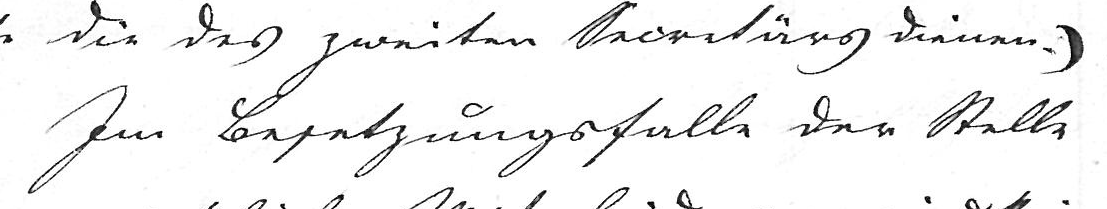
Im Besetzungsfalle der Stelle
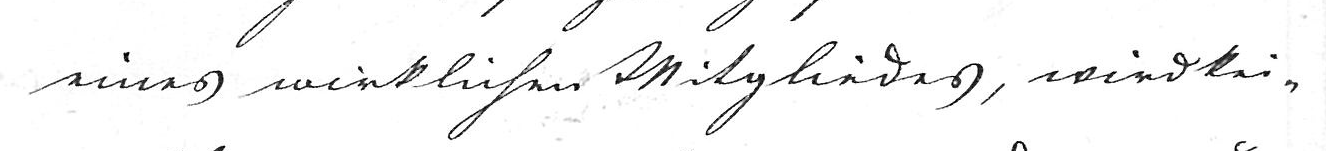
eines wirklichen Mitgliedes, wird kei-
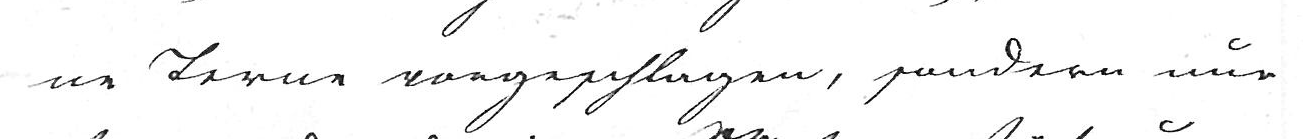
ner Terne vorgeschlagen, sondern nur
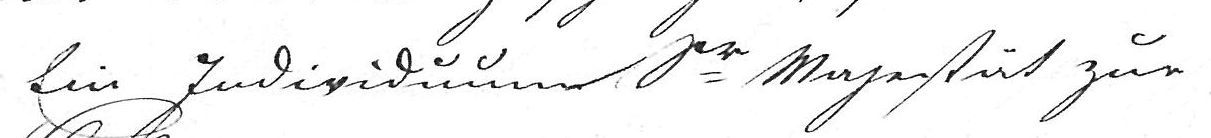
ein Individuum Sr Majestät zur
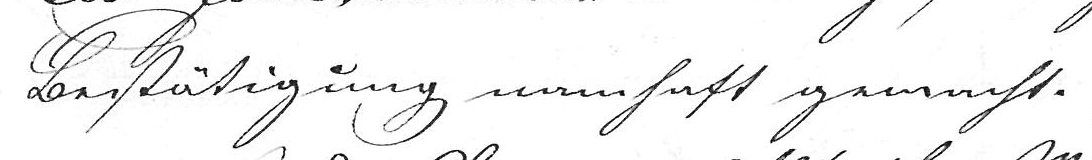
Befähigung namhaft gemacht.
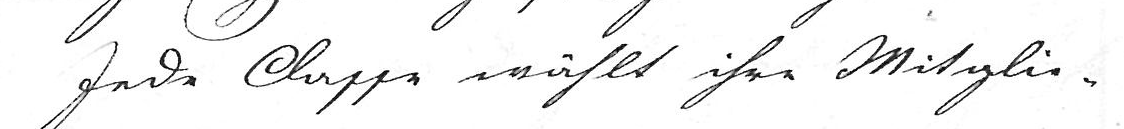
Jede Classe wählt ihre Mitglie-
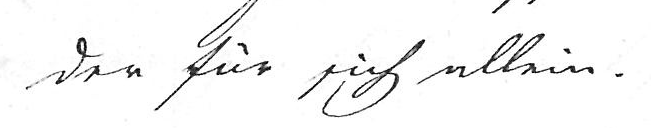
der für sich allein.
